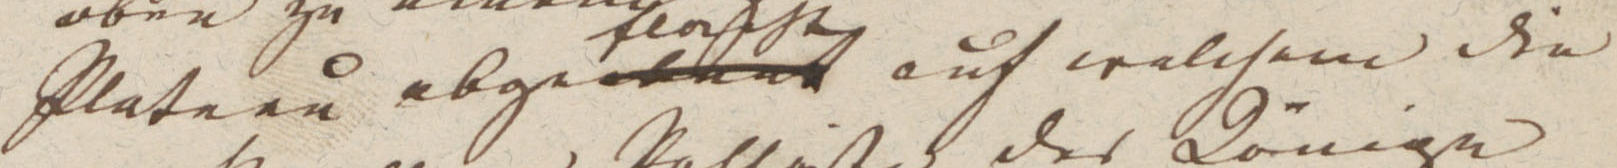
Plateau abgeebnetflacht auf welchem die
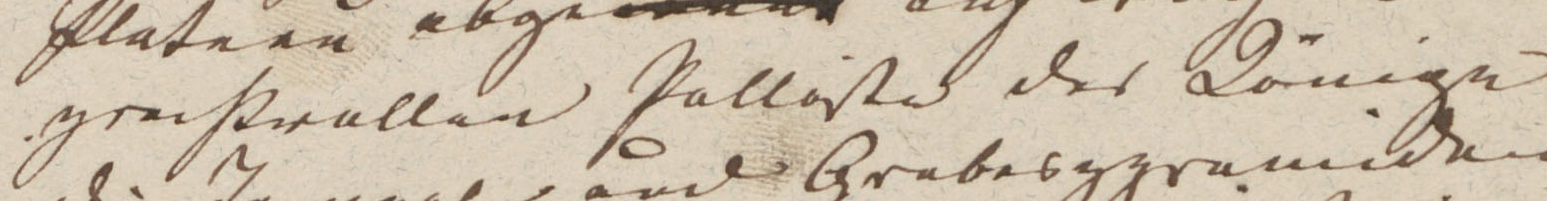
prachtvollen Palläste der Könige
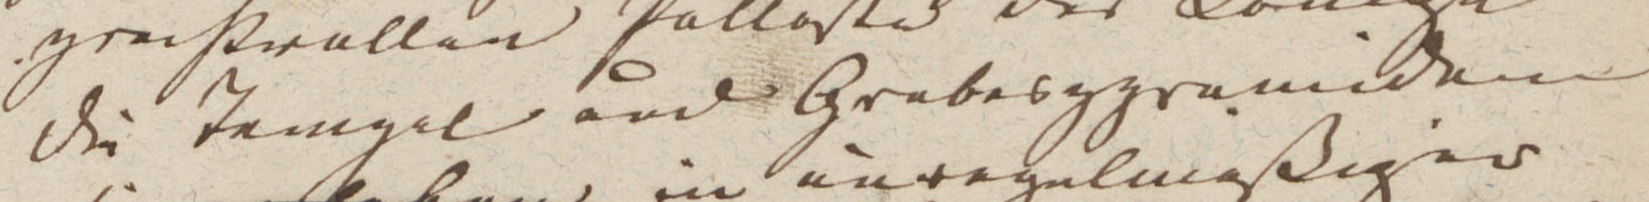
die Tempel und Grabespyramiden
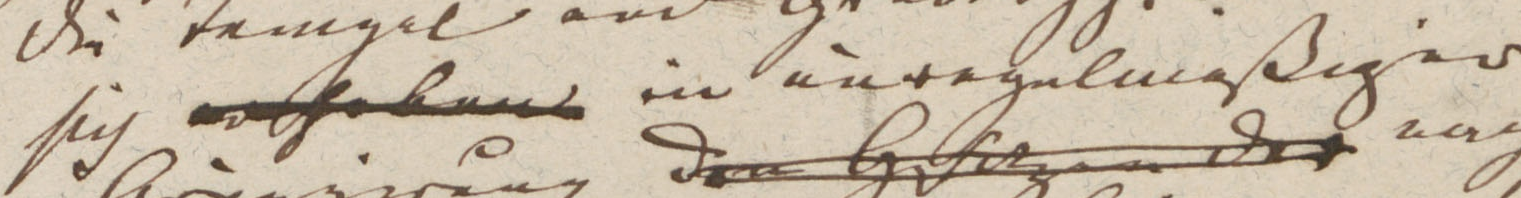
sich erhoben in unregelmässiger
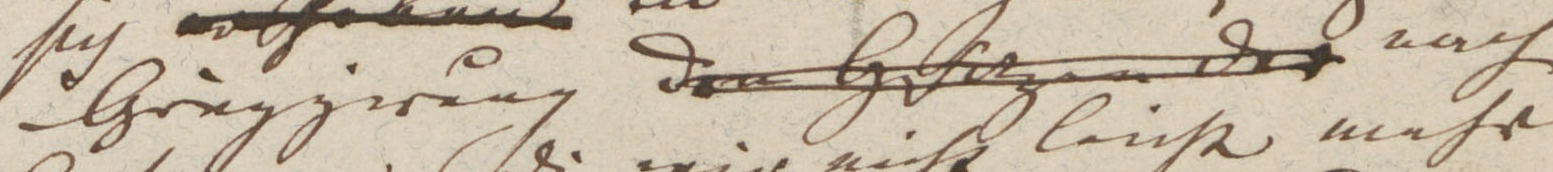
Gruppirung den Gesetzen der nach
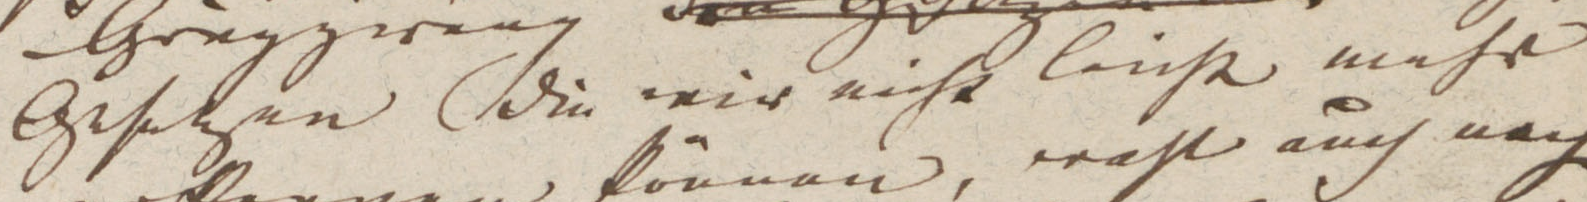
Gesetzen (die wir nicht leicht mehr
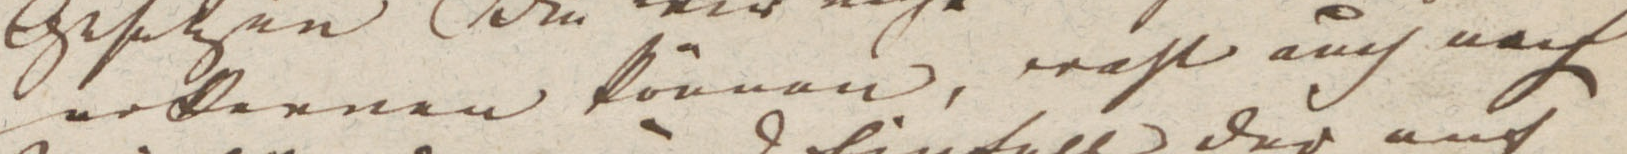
erkennen können, wohl auch nach
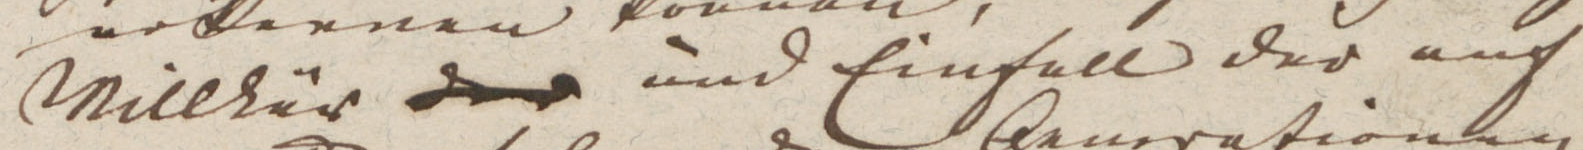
Willkür der und Einfall der auf
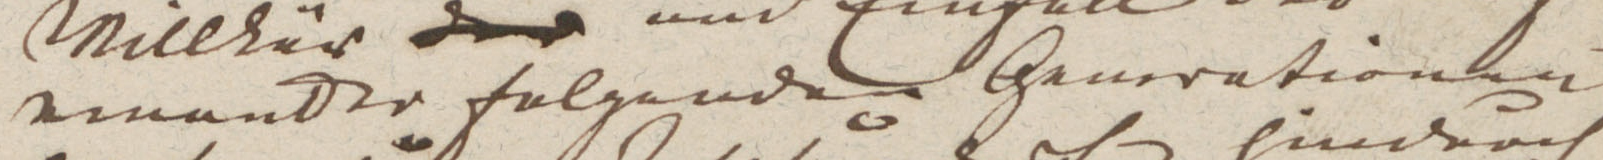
einander folgenden Generationen
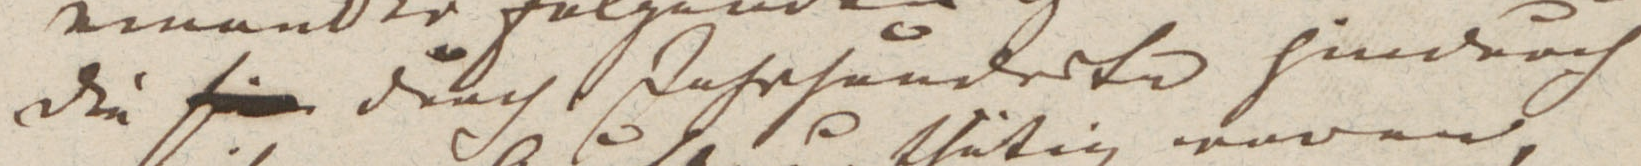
die sie durch Jahrhunderte hindurch
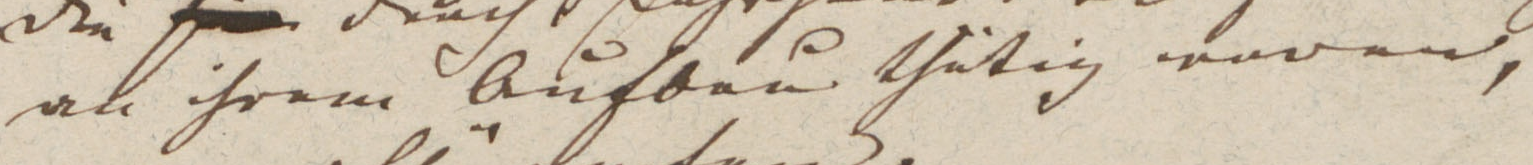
an ihrem Aufbau thätig waren,
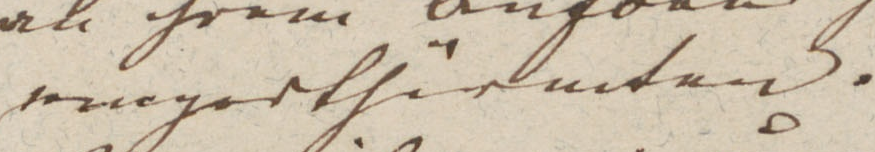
emporthürmten.
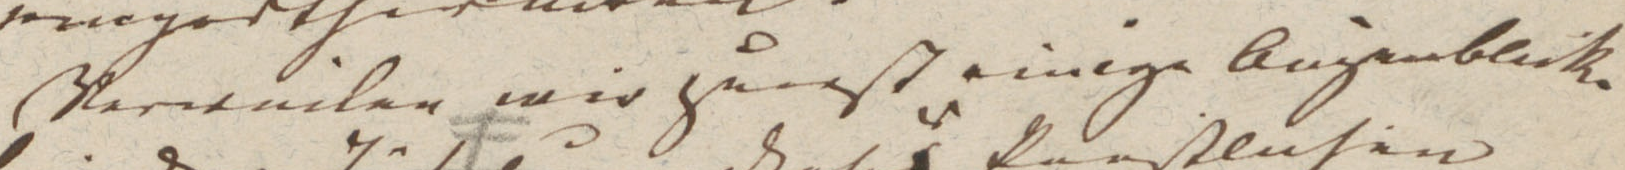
Verweilen wir zuerst einige Augenblicke
